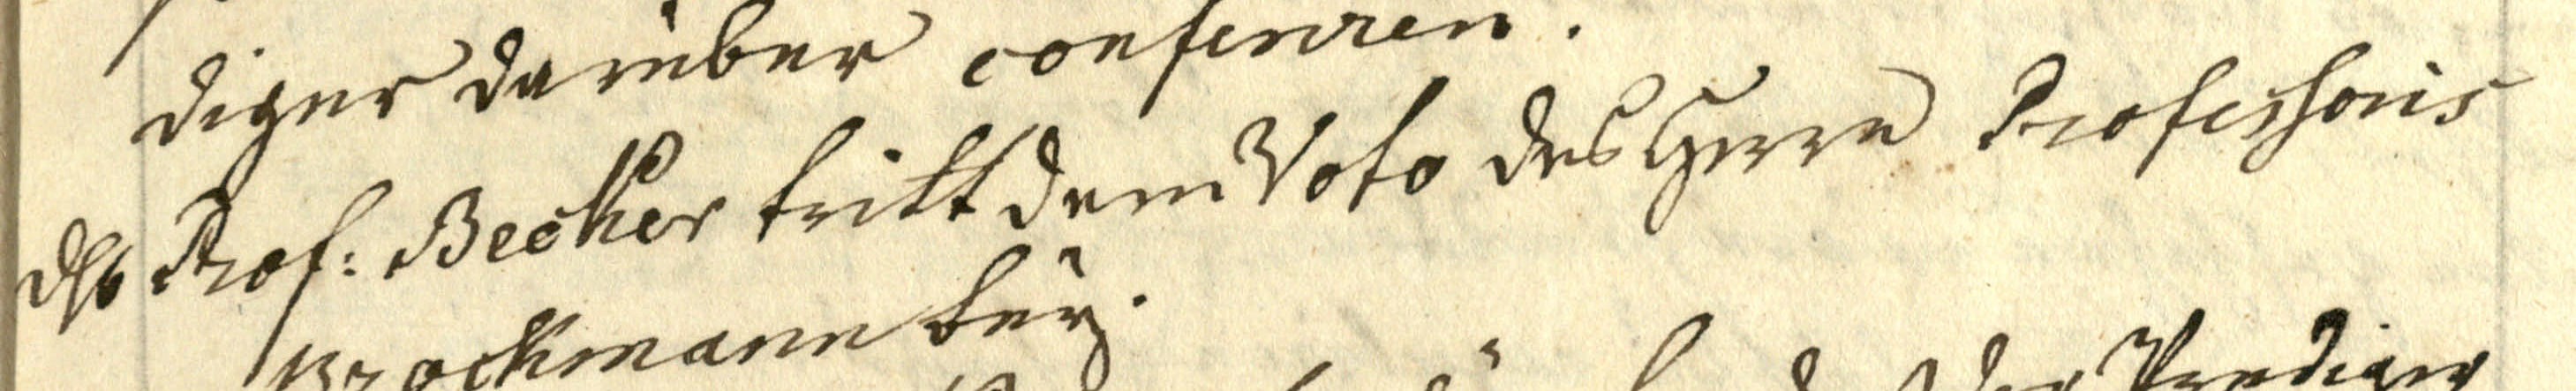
dh Prof. Becker tritt dem Voto des Herrn Professoris
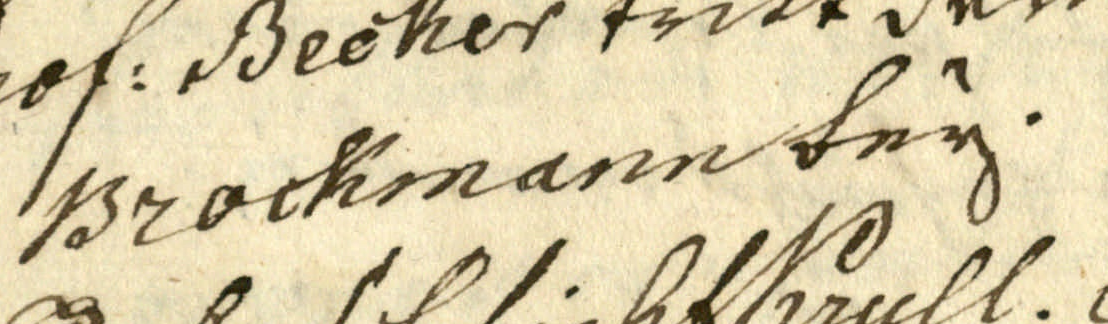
Brockmann beÿ.
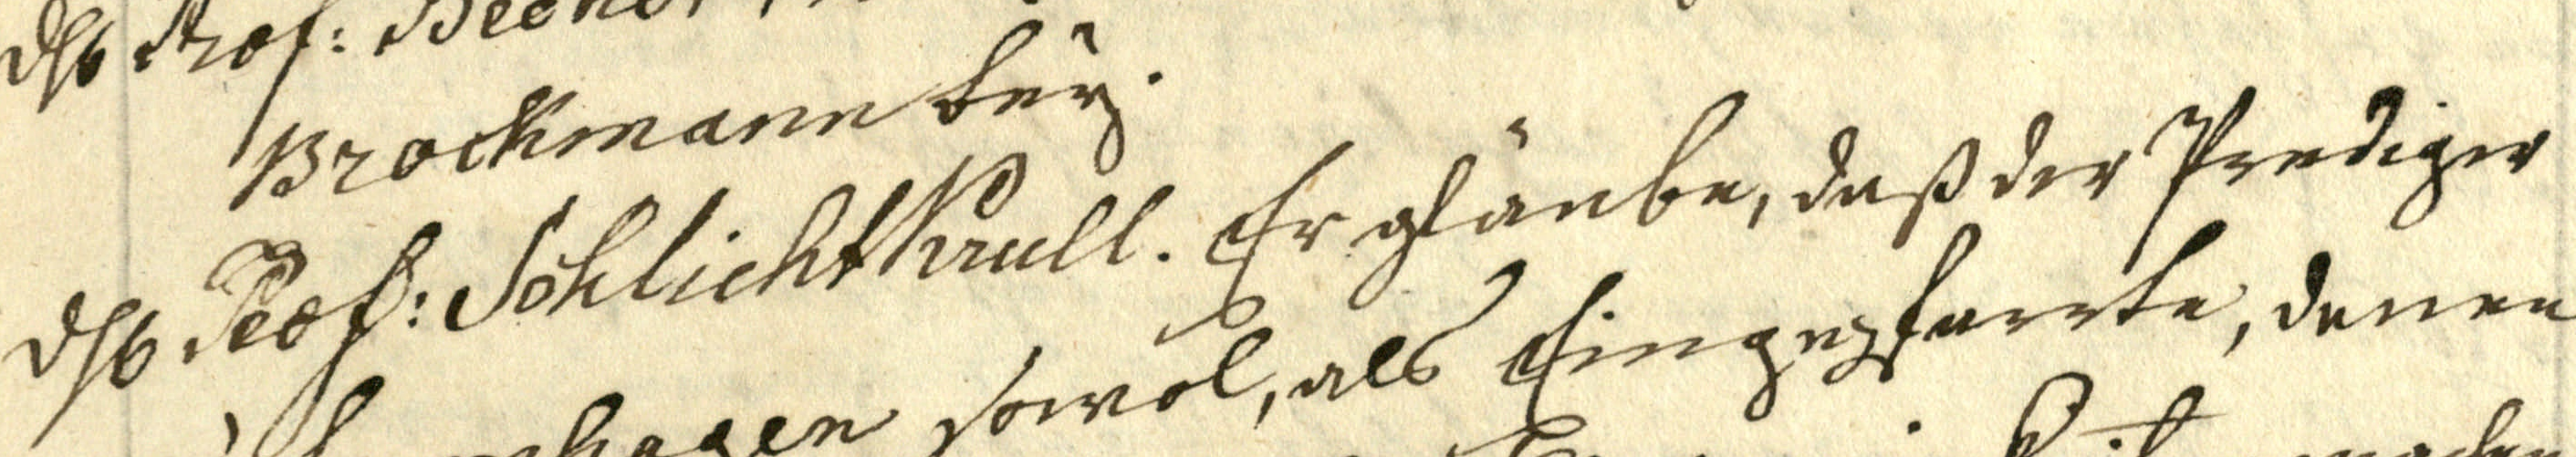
dh. Prof. Schlichtkrull. Er glaube, daß der Prediger
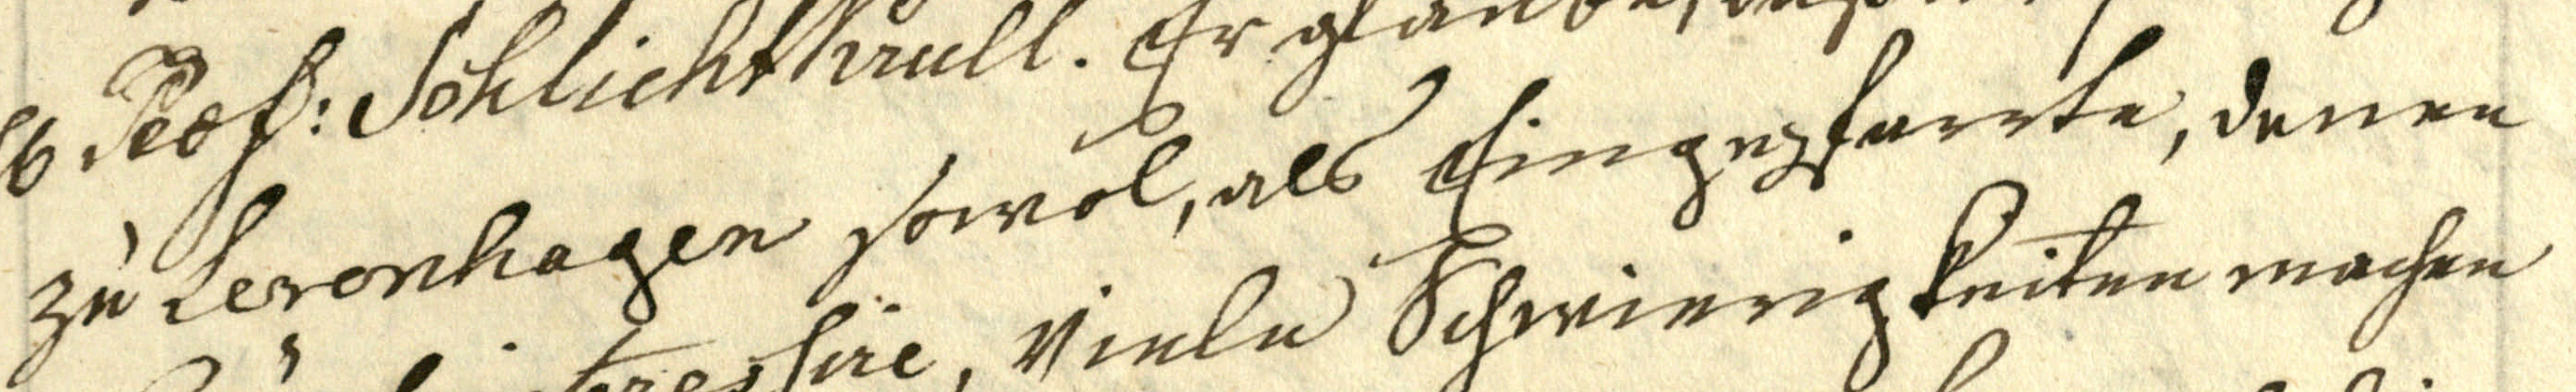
zu Levenhagen sowol, als Eingepfarrte, denen
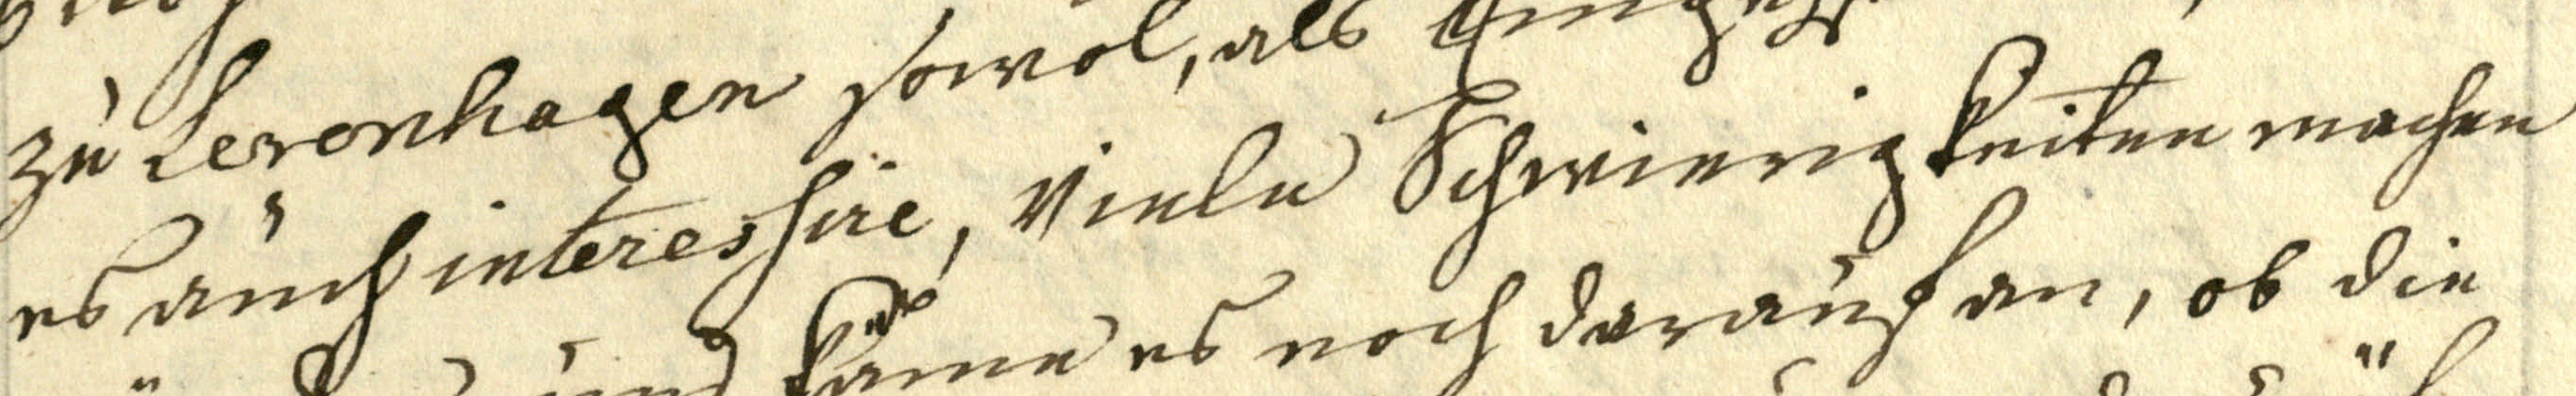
es auch interessire, viele Schwierigkeiten machen
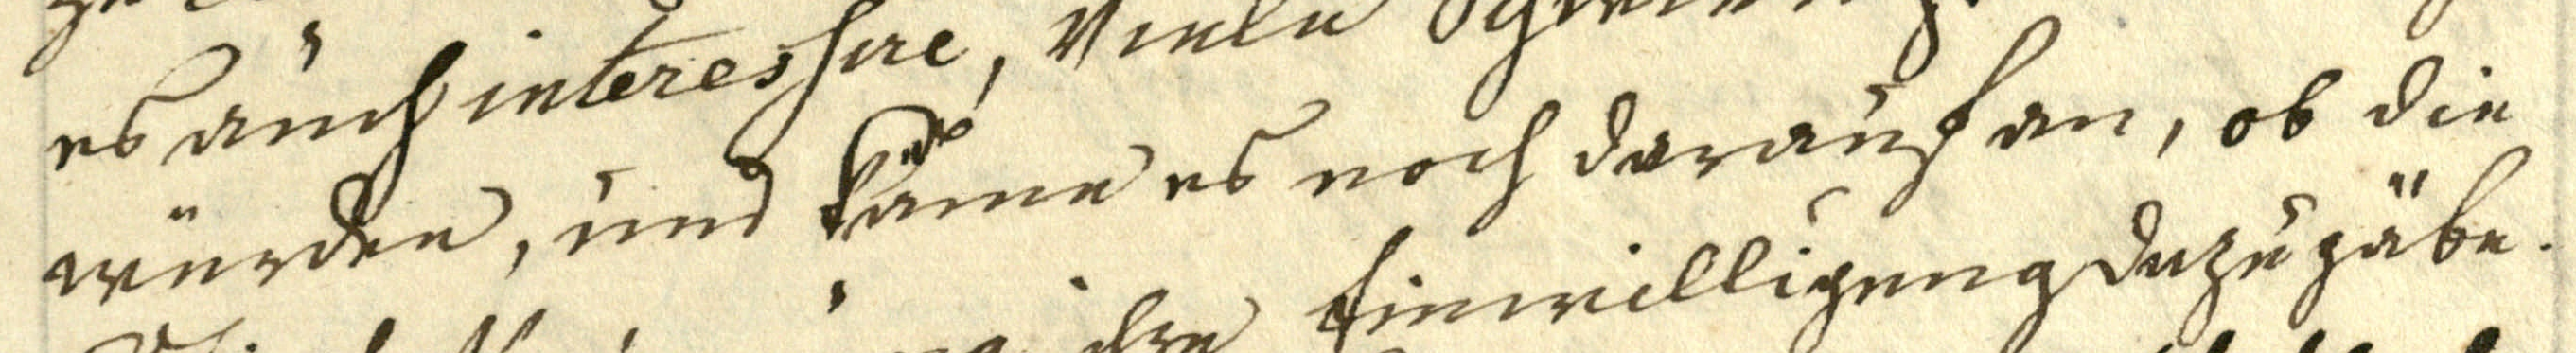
würde, und käme es noch darauf an, ob die
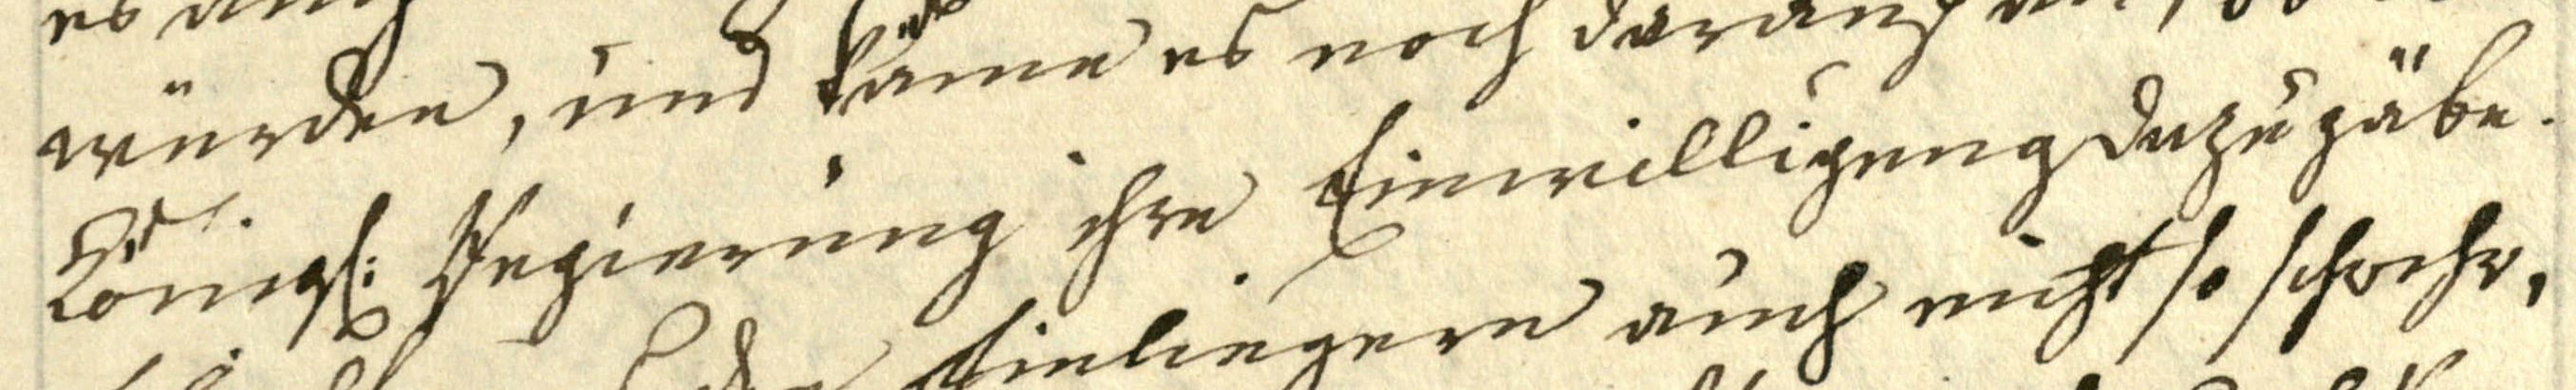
Königl. Regierung ihre Einwilligung dazu gäbe.
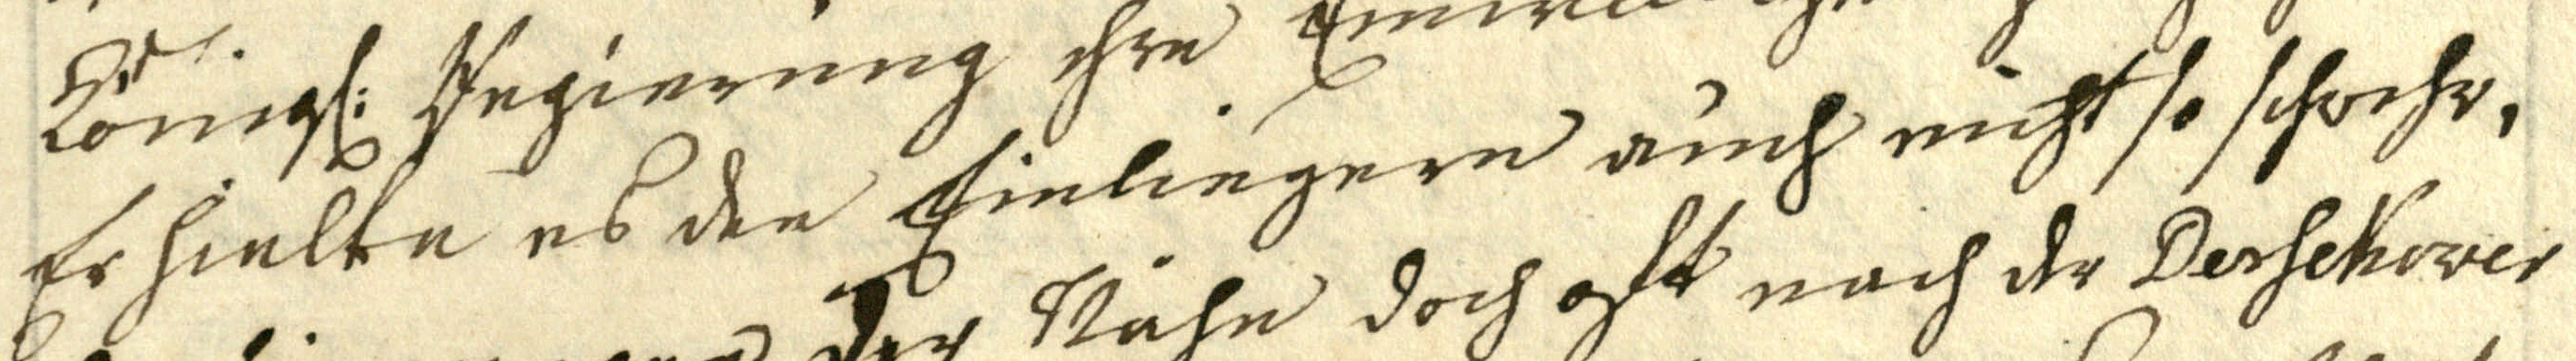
Er hielte es den Einliegern auch nicht so schwehr,
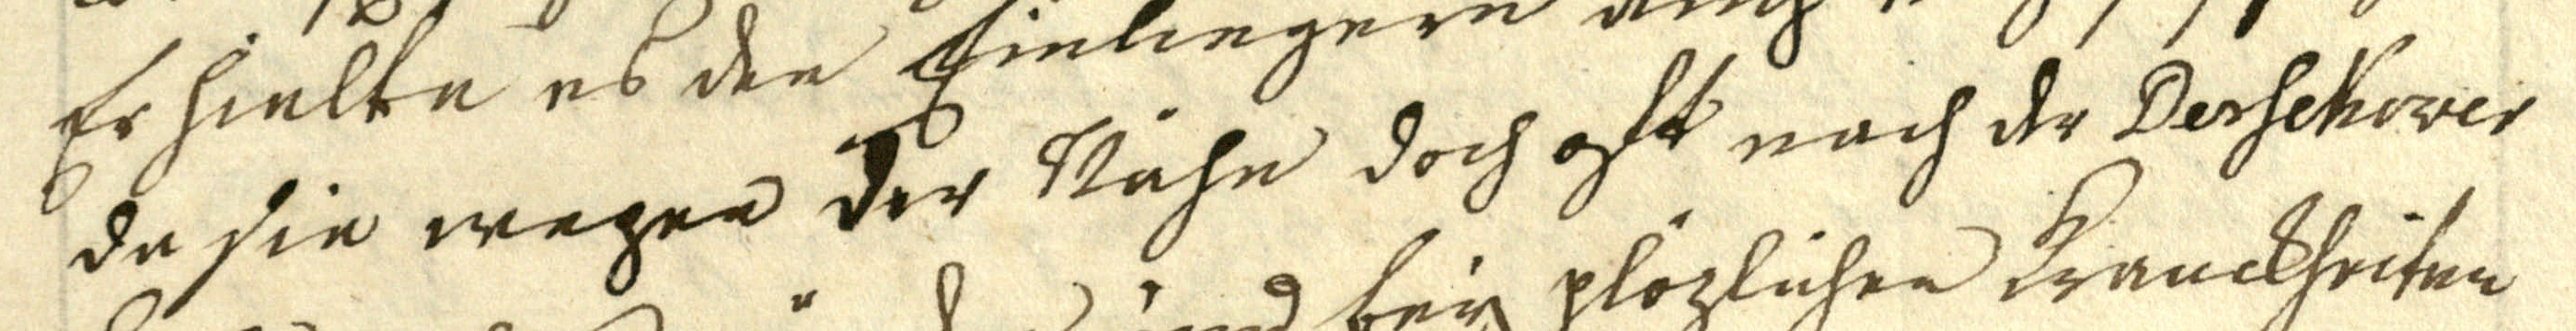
da sie wegen der Nähe doch oft nach der Dersekower
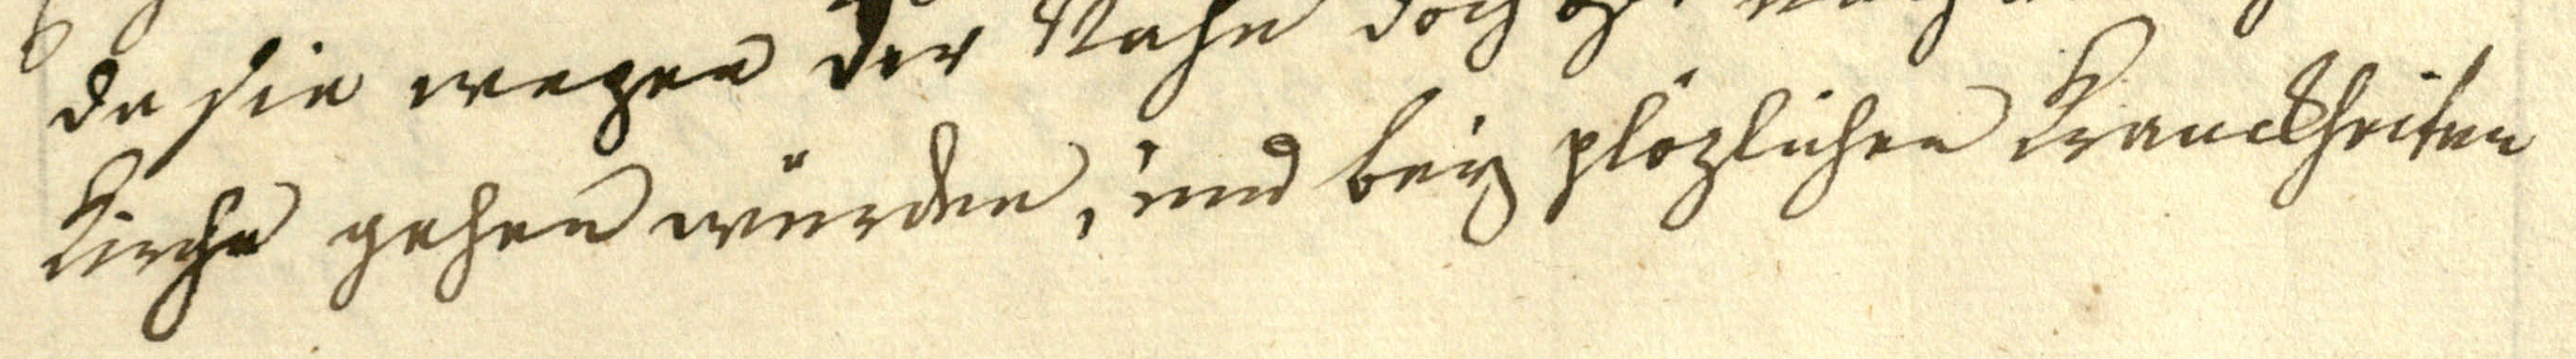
Kirche gehen würden, und beÿ plötzlichen Kranckheiten
